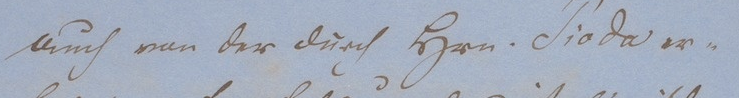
auch von der durch Hrn. Pioda er-
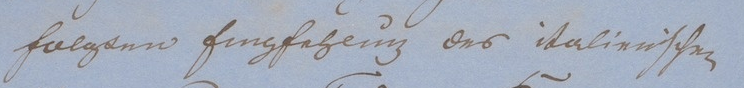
folgten Empfehlung des italienischen
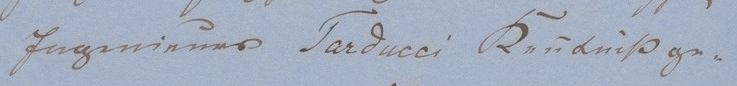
Ingenieurs Tarducci Kenntniß ge-
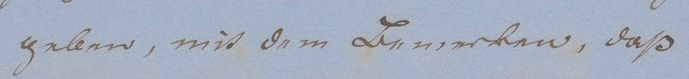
geben, mit dem Bemerken, daß
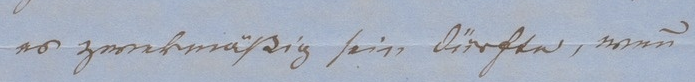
es zwekmäßig sein dürfte, wenn
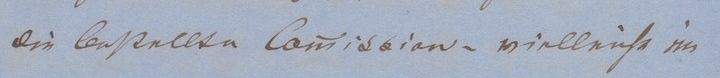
die bestellte Commission – vielleicht im
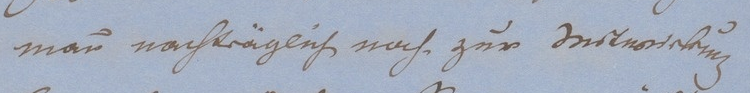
mann nachträglich noch zur Mitwirkung
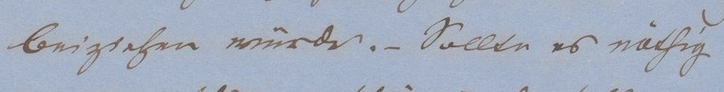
beiziehen würde. – Sollte es nöthig
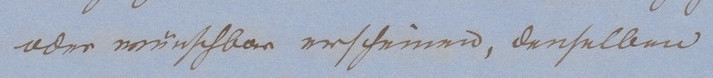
oder wünschbar erscheinen, denselben
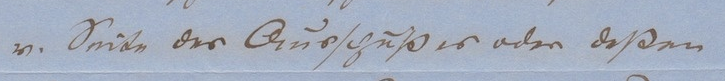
v. Seite des Ausschußes oder deßen
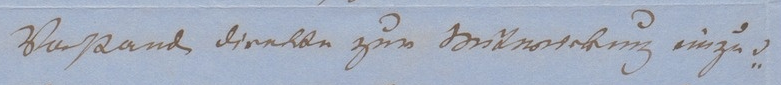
Vorstand direkte zur Mitwirkung einzu-
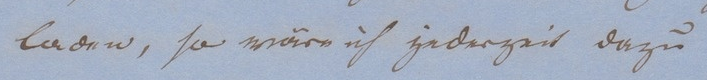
laden, so wäre ich jederzeit dazu
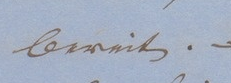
bereit. –
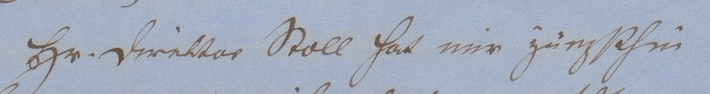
Hr. Direktor Stoll hat mir jüngsthin
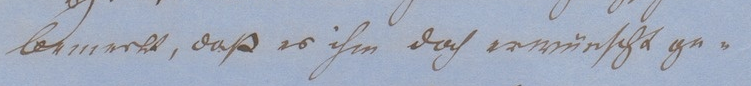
bemerkt, daß es ihm doch erwünscht ge-
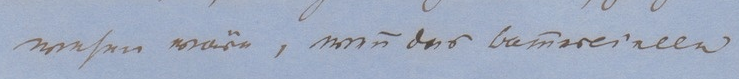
wesen wäre, wenn das commercielle
